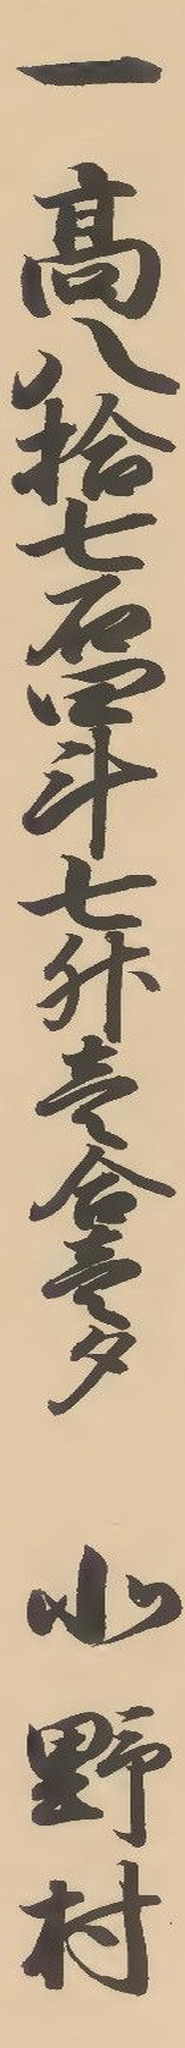一高八拾七石四斗七升壱合壱勺北野村
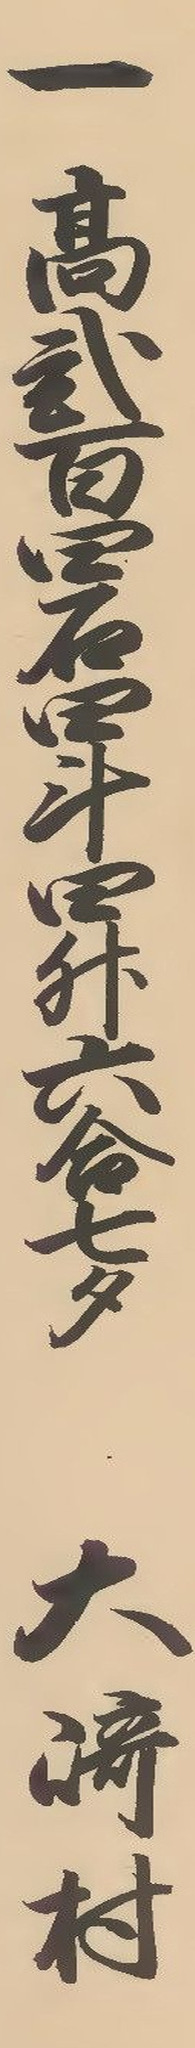一高弐百四石四斗四升六合七勺大崎村
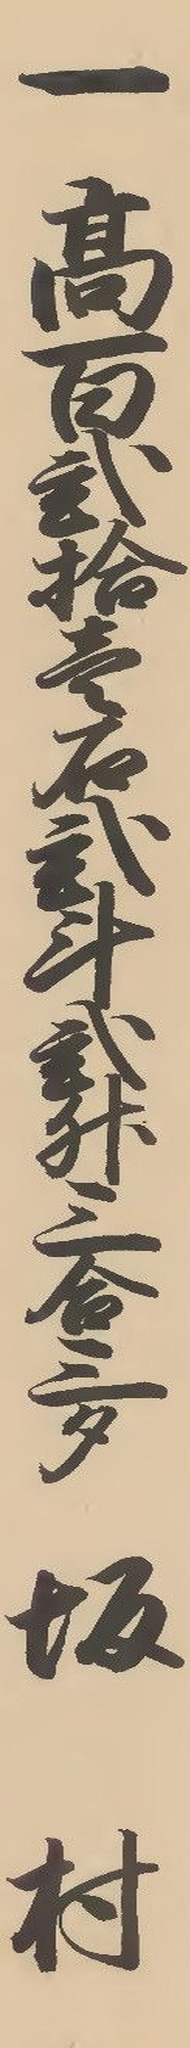一高百弐拾壱石弐斗弐升三合三勺坂村
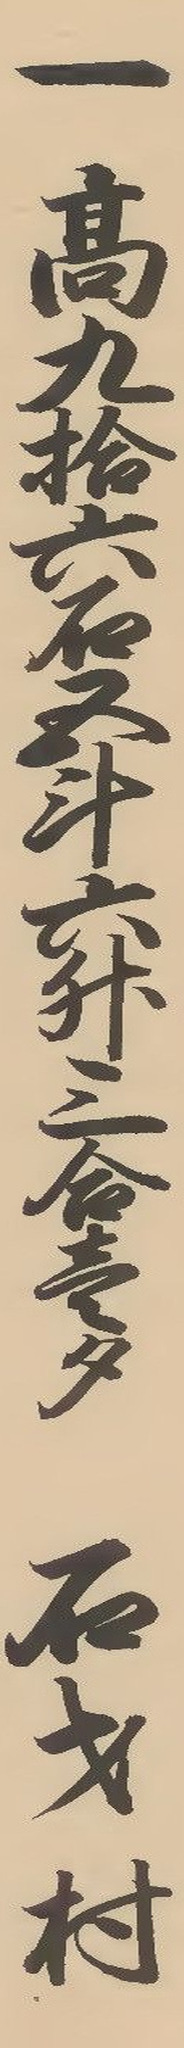一高九拾六石五斗六升三合壱勺石才村
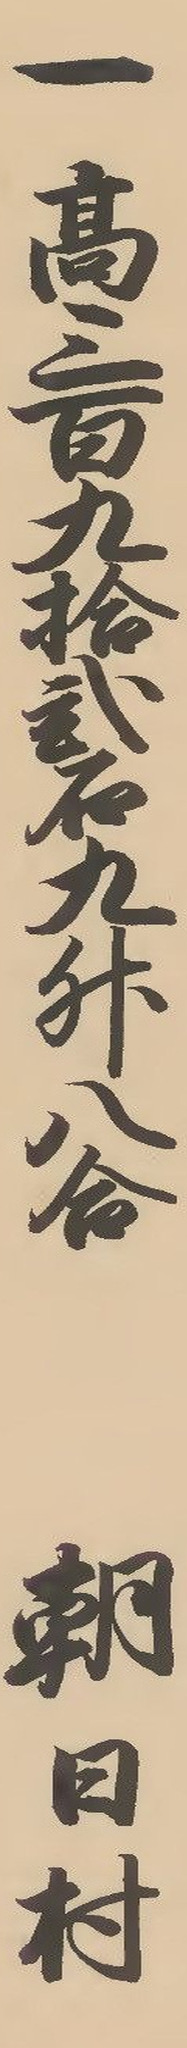一高三百九拾弐石九升八合朝日村

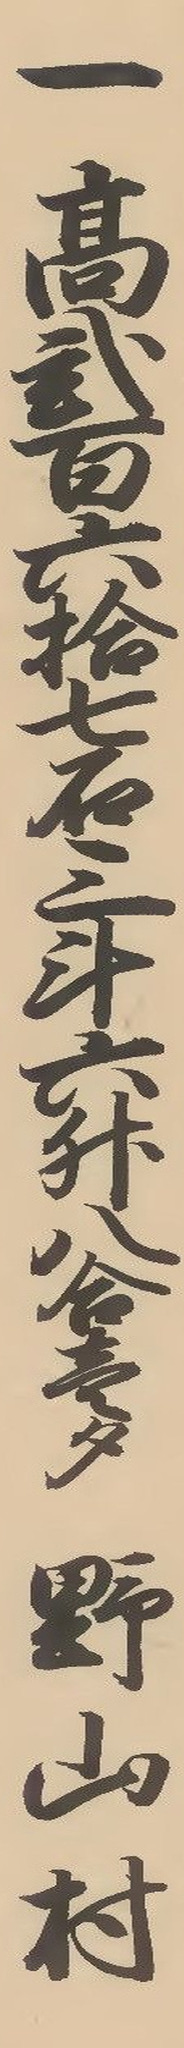一高弐百六拾七石三斗六升八合壱勺野山村
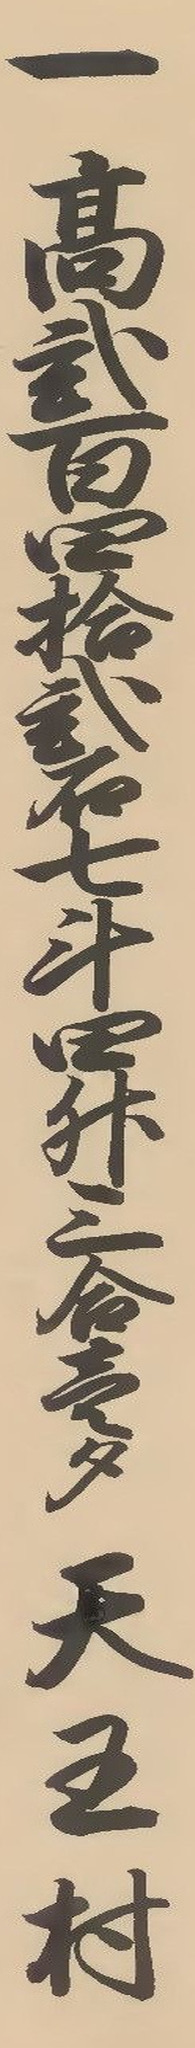一高弐百四拾弐石七斗四升三合壱勺天王村
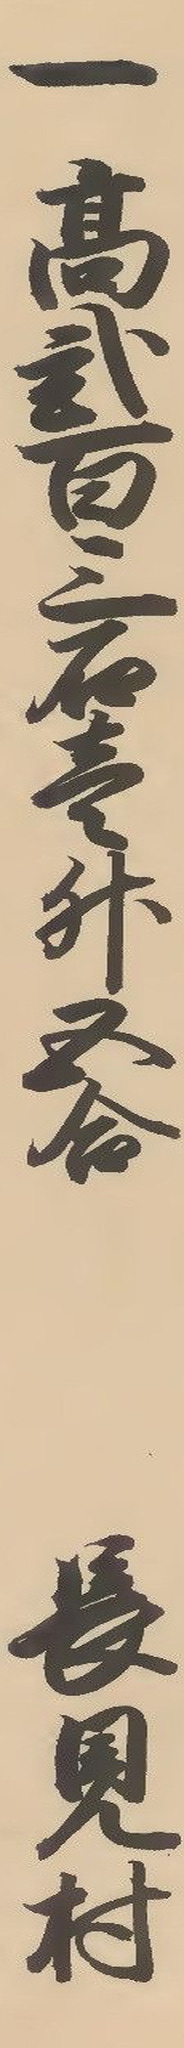一高弐百三石壱升五合長見村
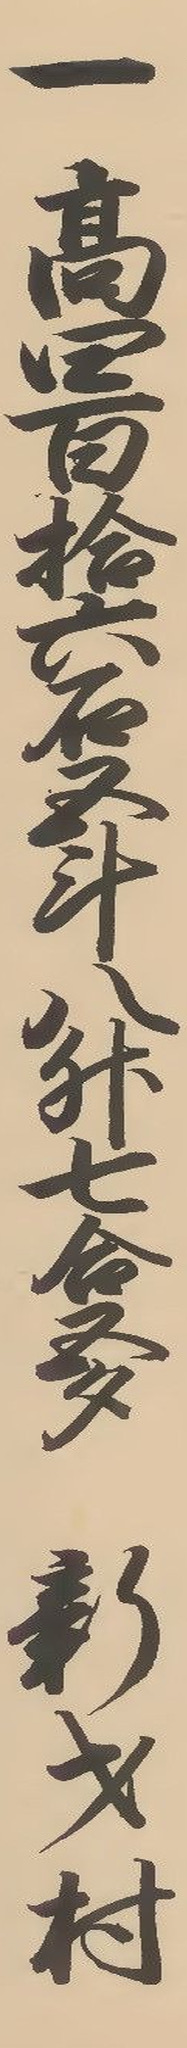一高四百拾六石五斗八升七合五勺新才村
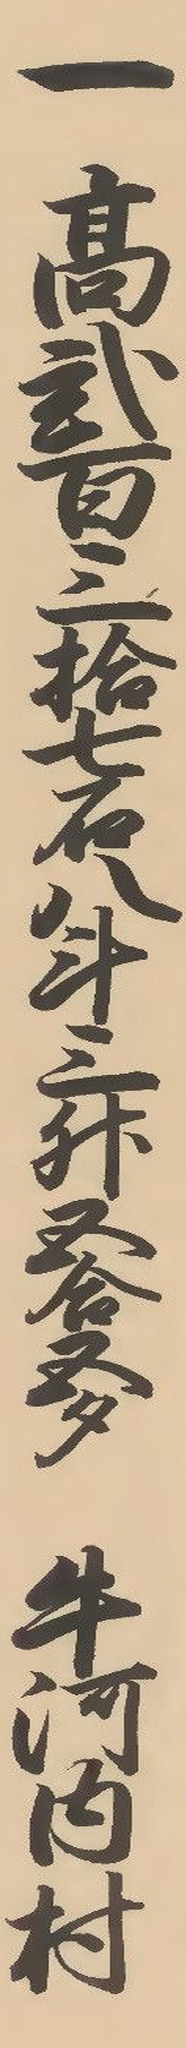一高弐百三拾七石八斗三升五合五勺牛河内村
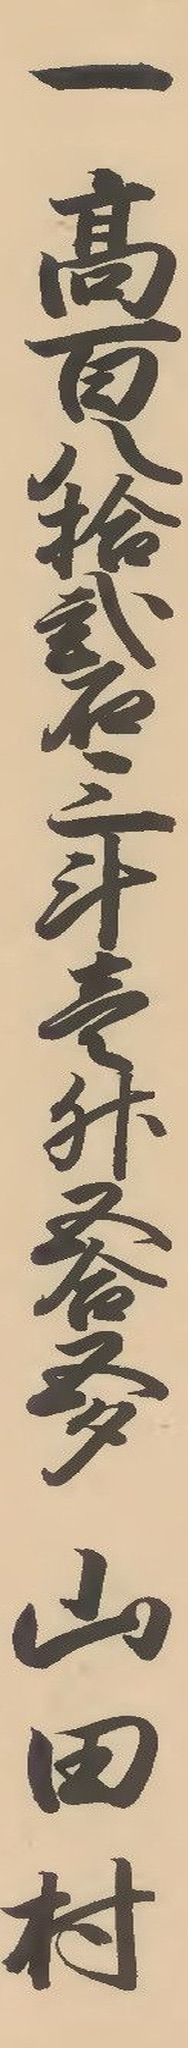一高百八拾弐石三斗壱升五合五勺山田村
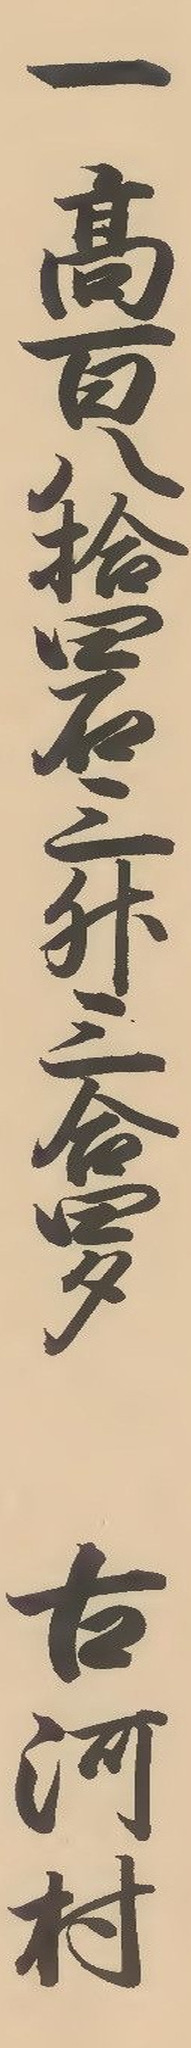一高百八拾四石三升三合四勺古河村
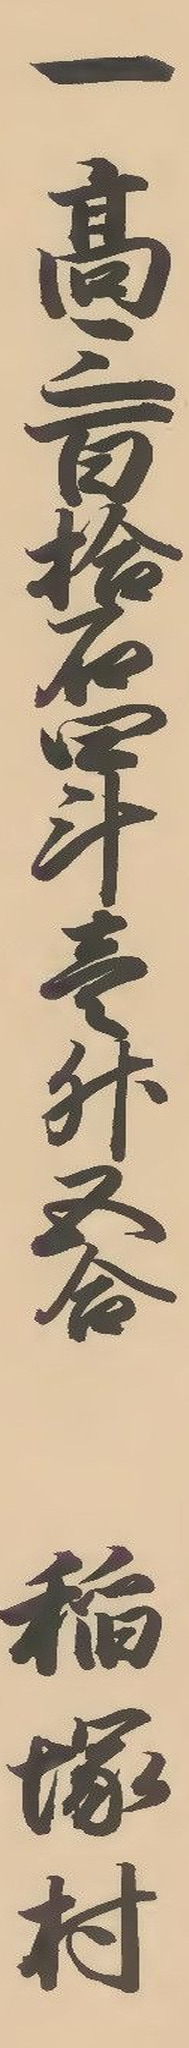一高三百拾石四斗壱升五合稲塚村

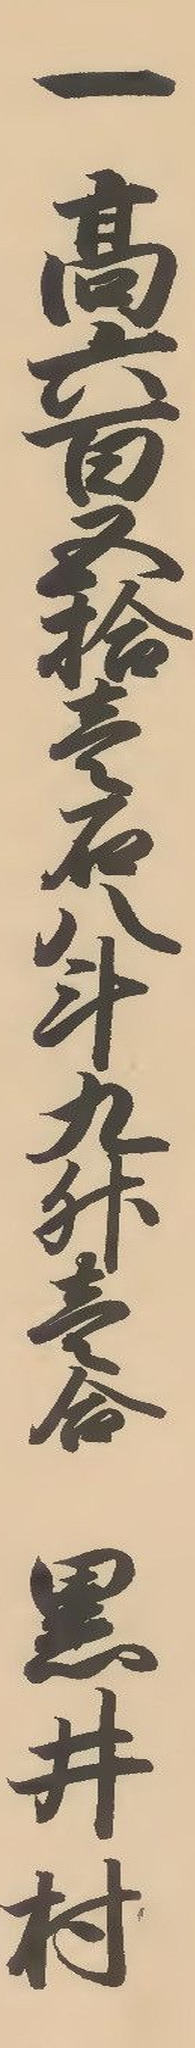一高六百五拾壱石八斗九升壱合黒井村
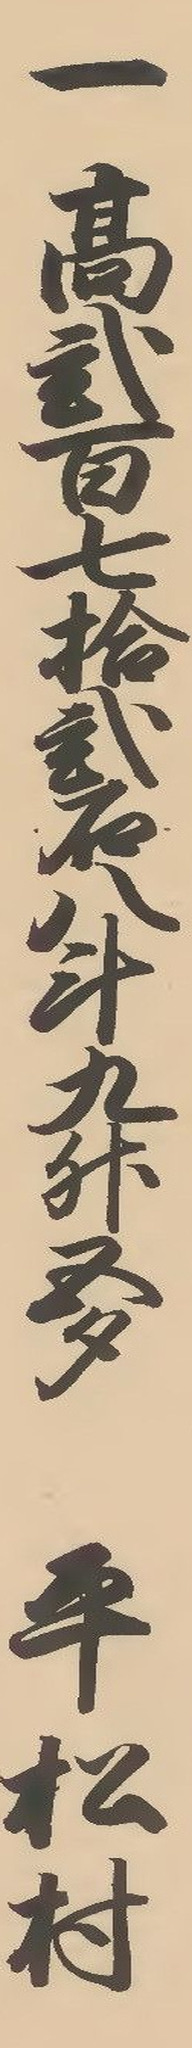一高弐百七拾弐石八斗九升五勺平松村
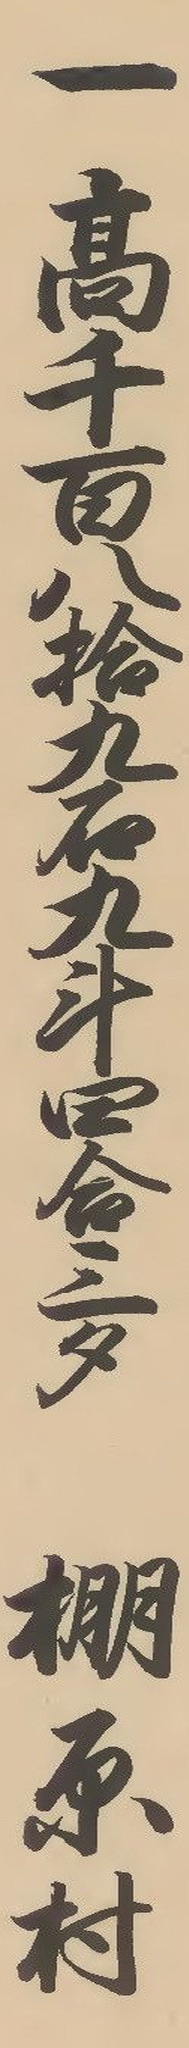一高千百八拾九石九斗四合三勺棚原村
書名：丹波国郷帳
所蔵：国立公文書館 National Archives of Japan
